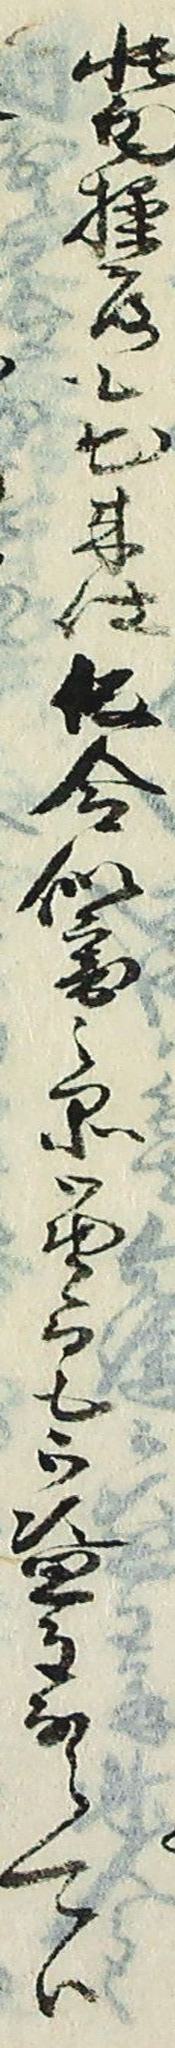帳面操落も出来仕仮令似寄之品御坐候而も被盗主ならてハ
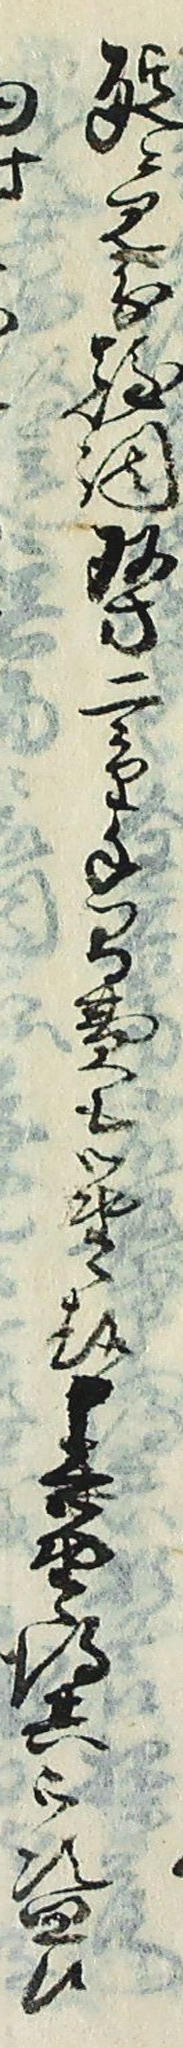聢と見分難調双方二重手間費も御坐候趣申上御坐候得共被盗候
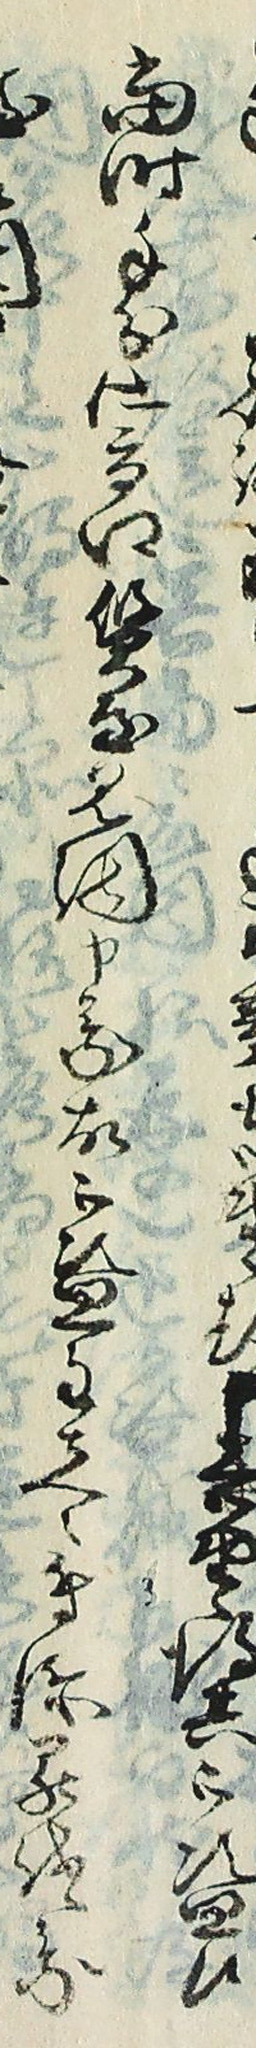當時手分仕市郷質屋見調申義故被盗主先ニ付添罷越候義
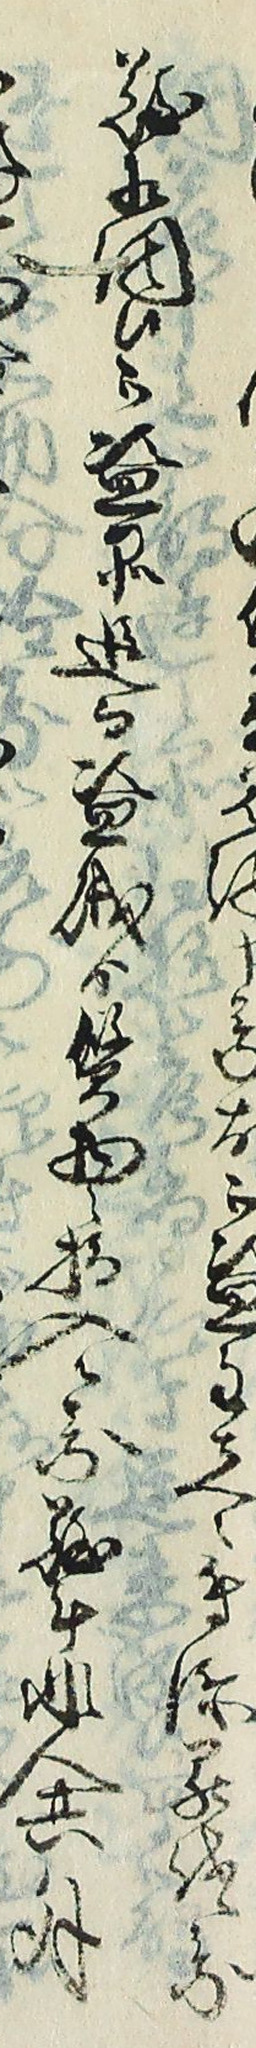難相調候被盗品追而盗賊ゟ質物ニ指入候義難計非人共外
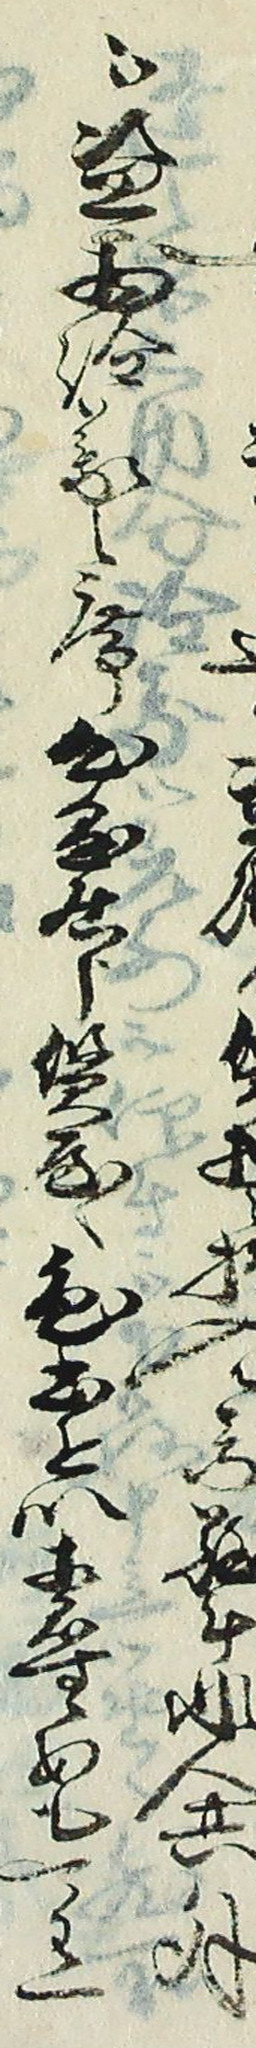被盗物詮義之席心懸居申質屋へ色書を以相尋候義も可有
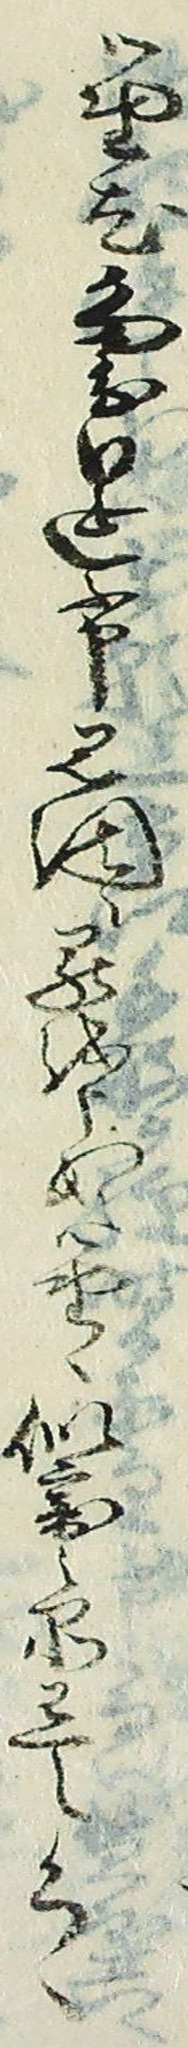御坐候尤多分日延不申見調ニ罷越申義ニ御坐候似寄之品有之候ハヽ
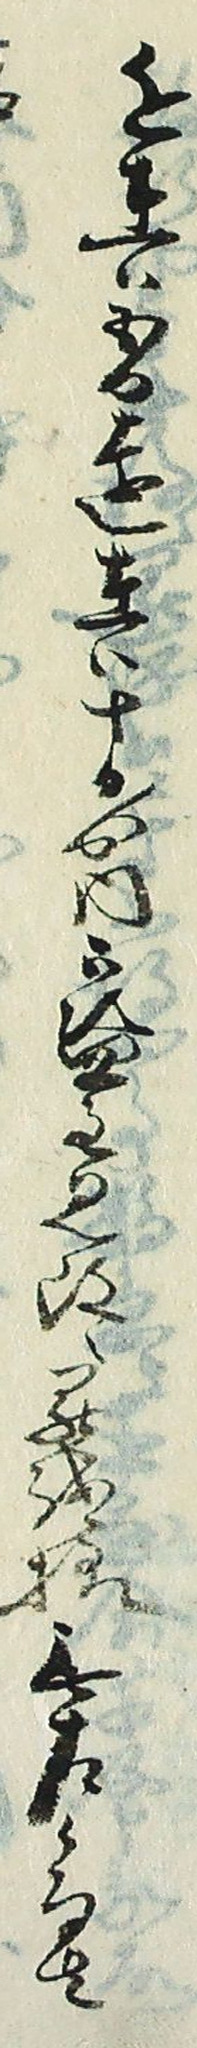近在ハ五日遠在ハ十日ゟ内被盗主見改へ罷越候様無左候而者
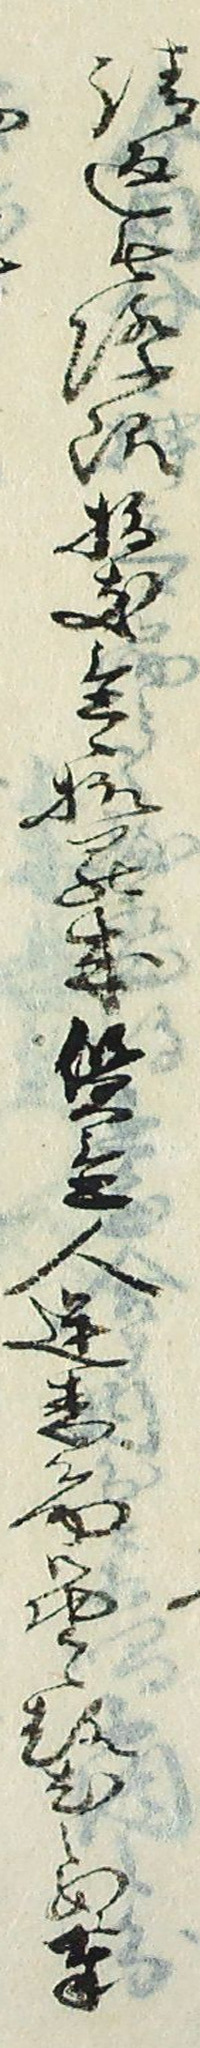請返無際限指支置候様罷成質置人迷惑筋御坐候趣尤之義ニ奉
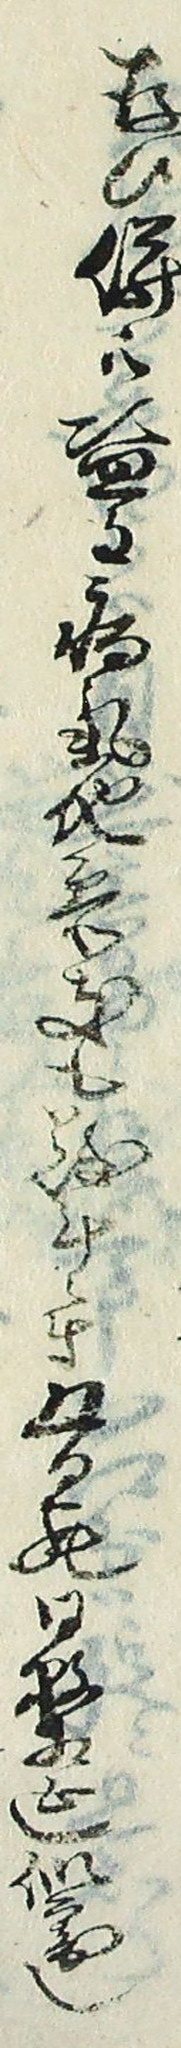存候併被盗主病氣他参支も難計ニ付旦日罷日数相延似寄之
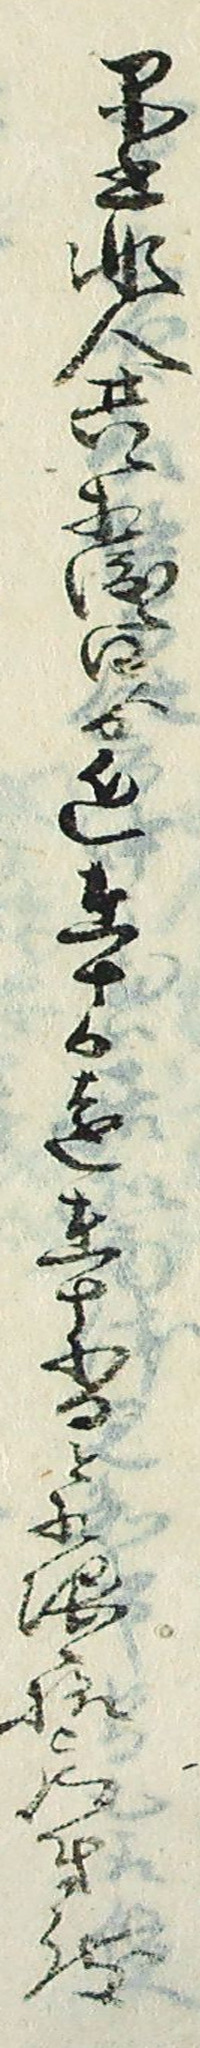品書非人共へ相渡候日ゟ近在十日遠在十五日を相限候様被仰付度
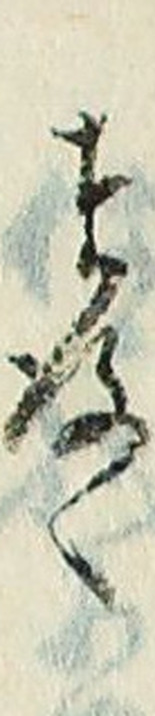奉存候
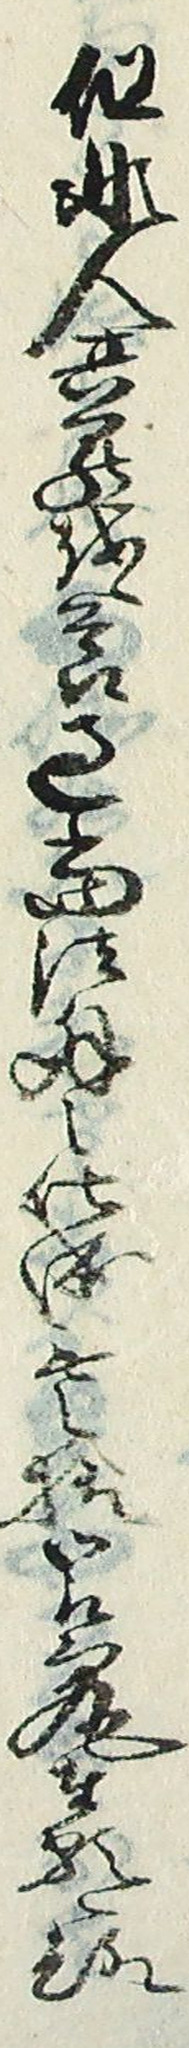但非人共罷越候節過當法外之仕成無之様御取究奉願之趣
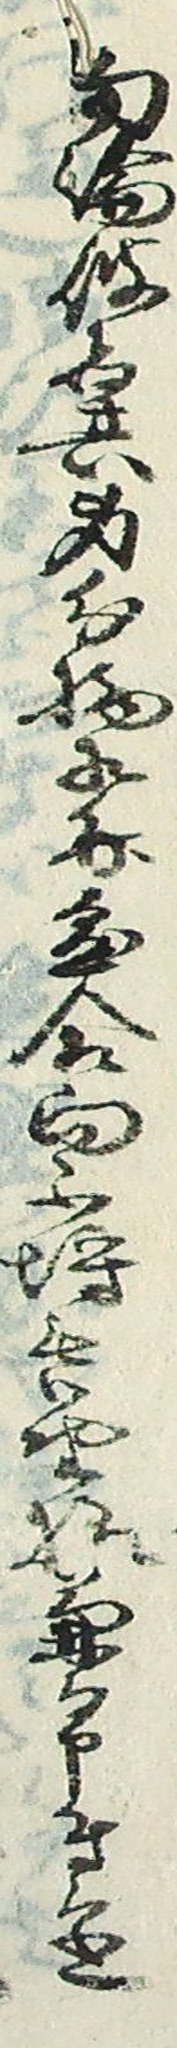勿論彼者共身分柄相弁懸合向不埒無御坐様兼而申付置
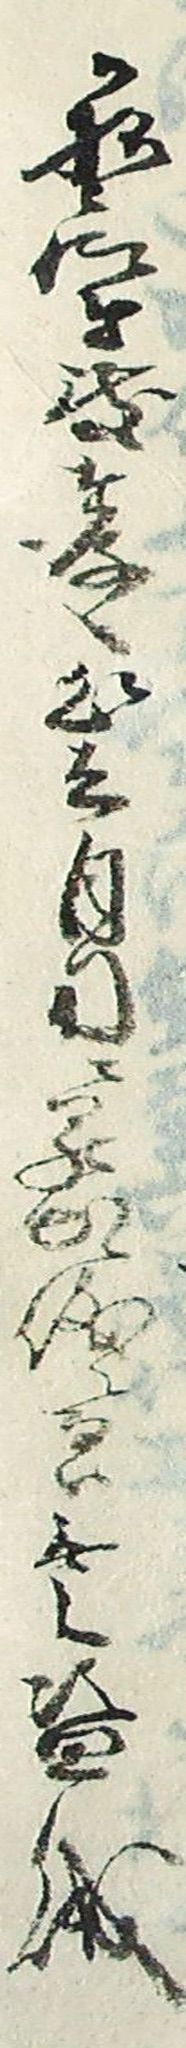候様被仰付度奉存候乍去自用ニ罷出候儀ニ而ハ無之盗賊

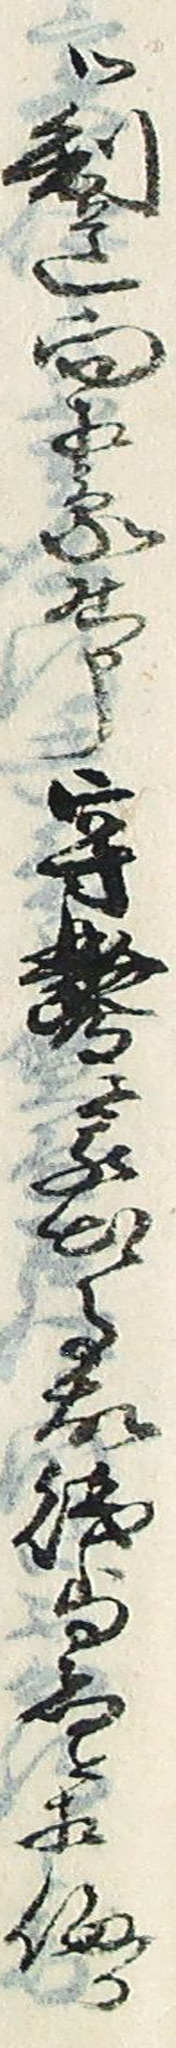御制道向相蒙居申穿鑿ニ罷出候事故賤布者と相侮り
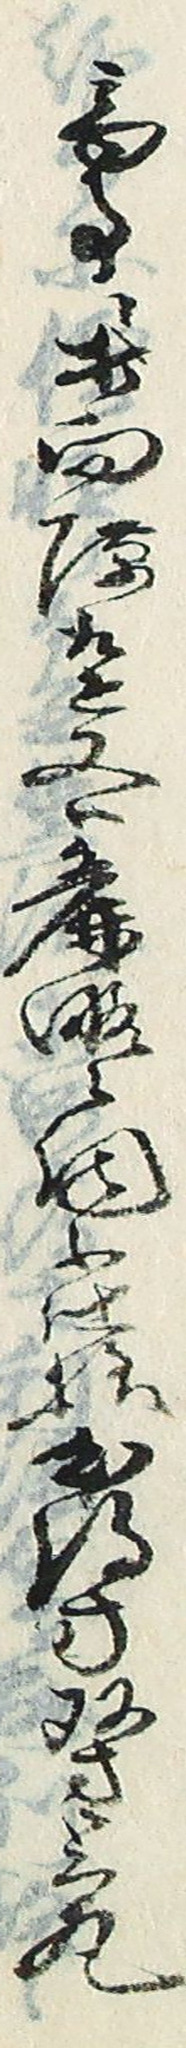商事ニ打向隙取せ又ハ麁略ニ調不仕様心得方双方御究
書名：市郷質屋株御取究並御書出御趣法之写
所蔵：鳴門教育大学 Naruto University of Education
